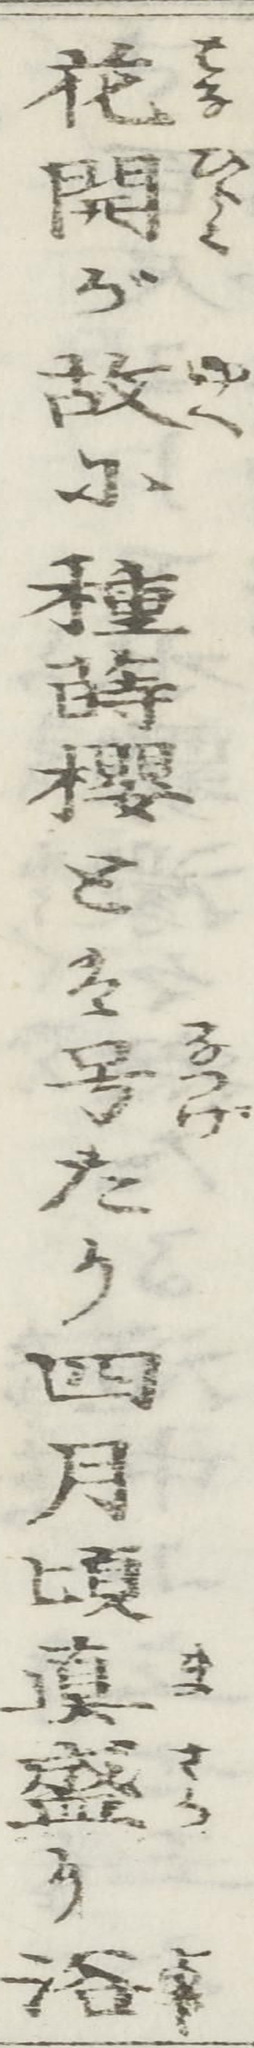花開が故に種蒔桜とは号たり四月頃真盛り浴
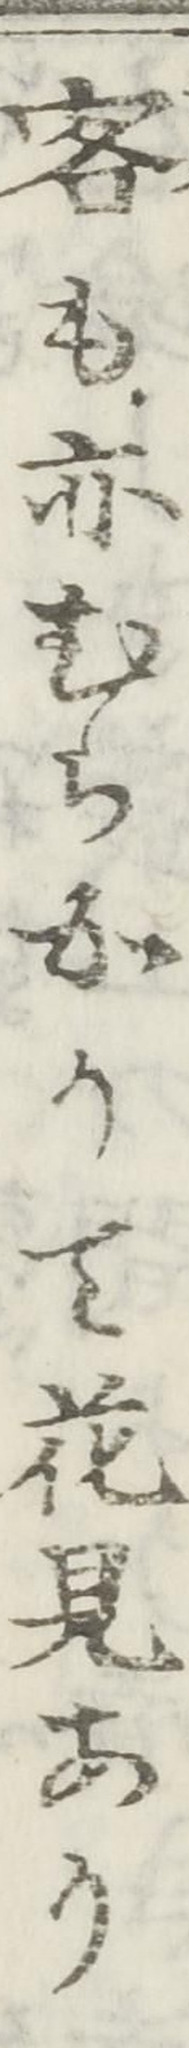客も亦むらがりて花見あり
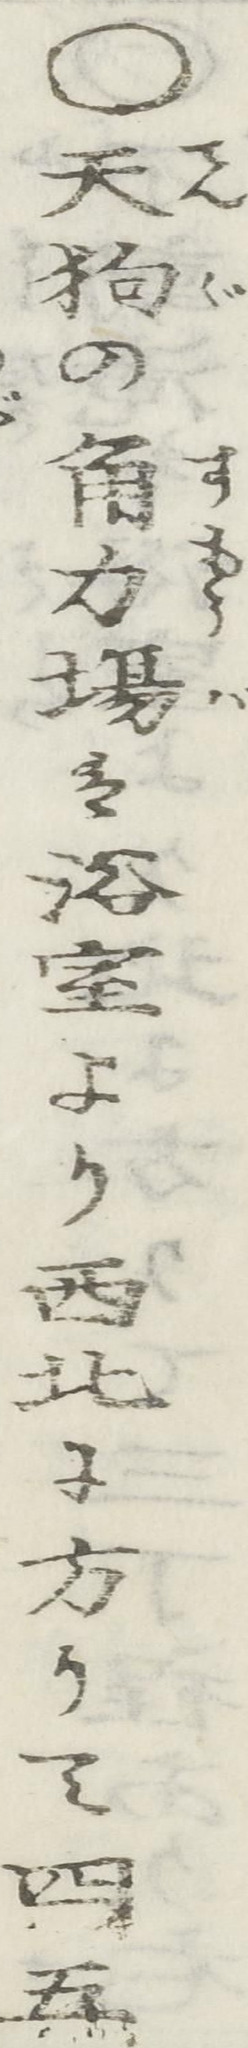〇天狗の角力場を浴室より西北に方りて四五
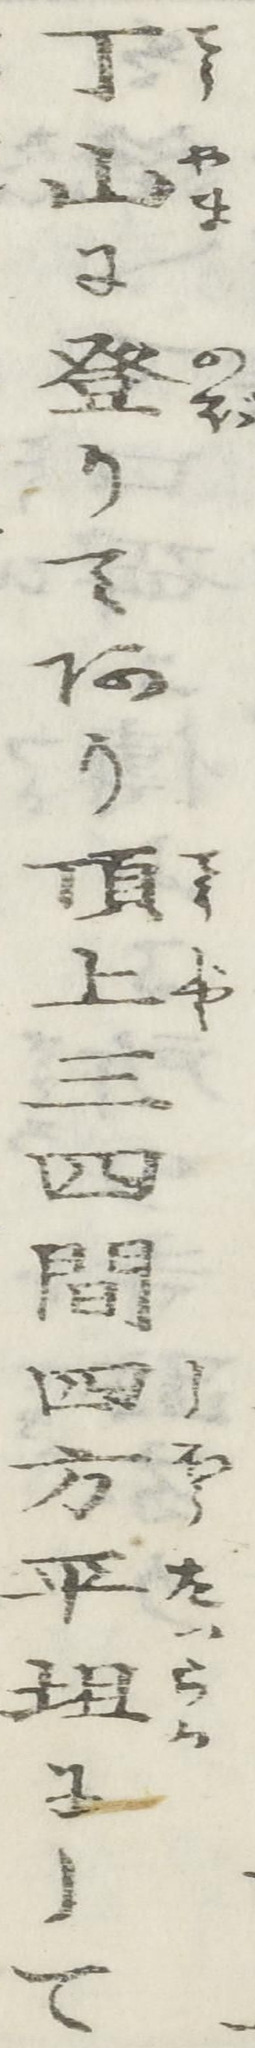丁山に登りてあり頂上三四間四方平坦にして
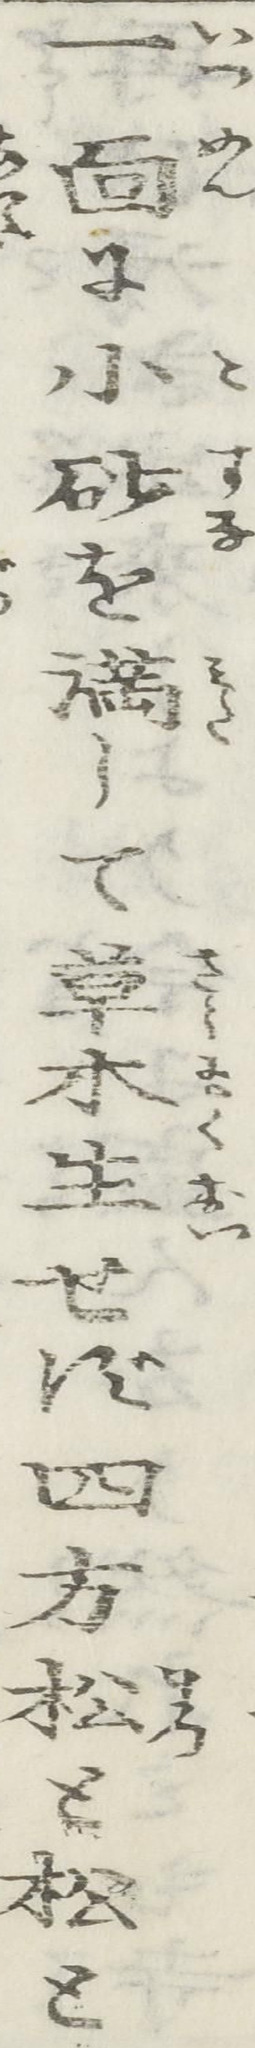一面に小砂を満して草木生せず四方松と松と
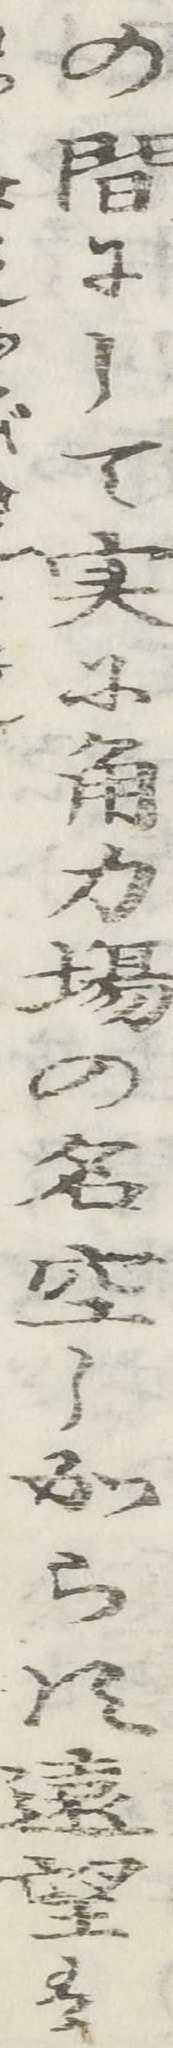の間にして実に角力場の名空しからす遠望を
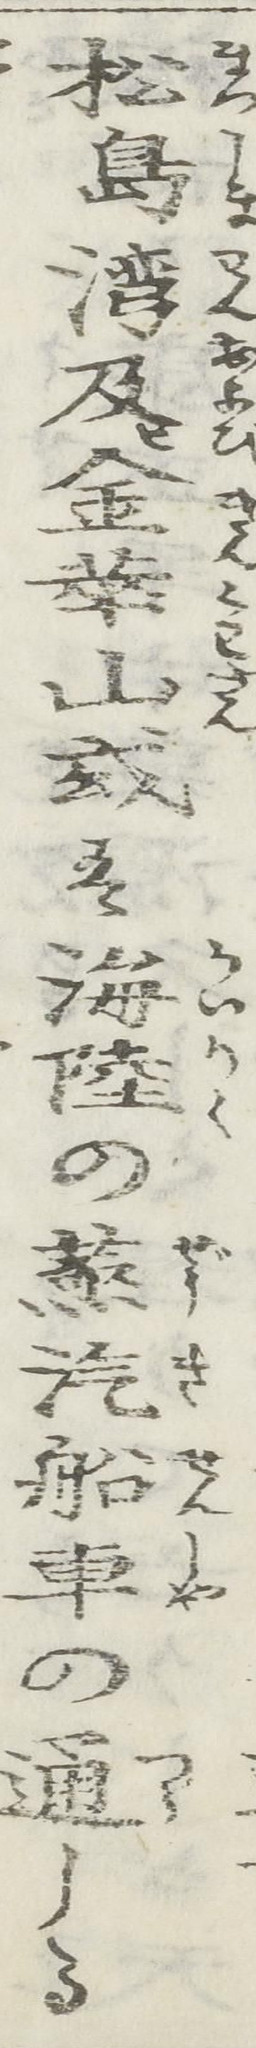松島湾及金葉山或は海陸の蒸汽船車の通しる
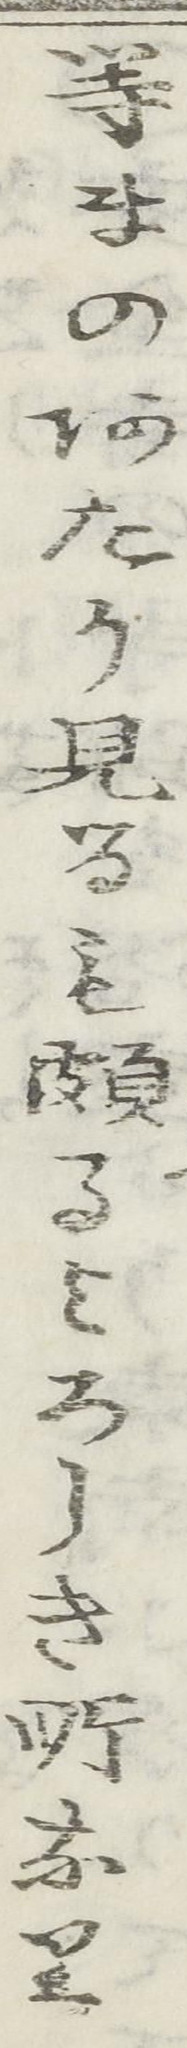等まのあたり見ると頗るよろしき所なり

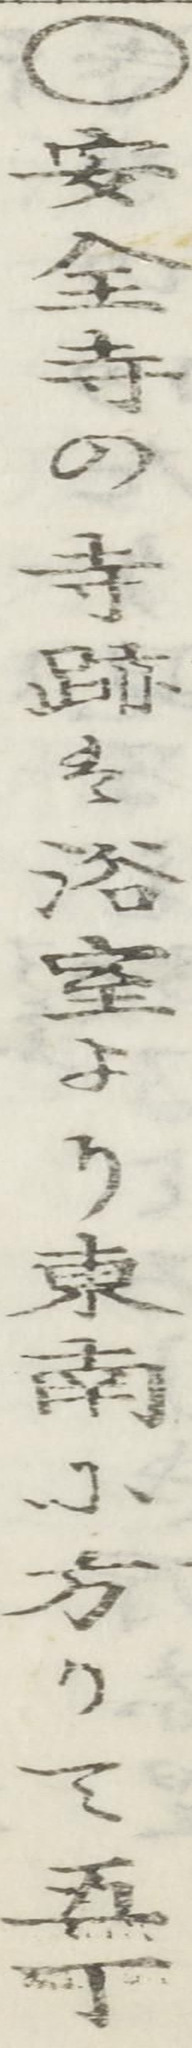○安全寺の寺跡を浴室より東南に方りて五丁
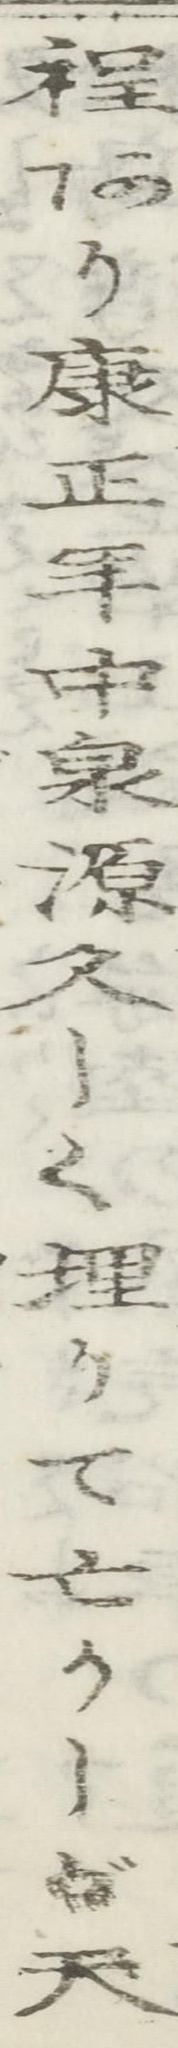程あり康正年中泉源久しく埋りて亡りしどが天
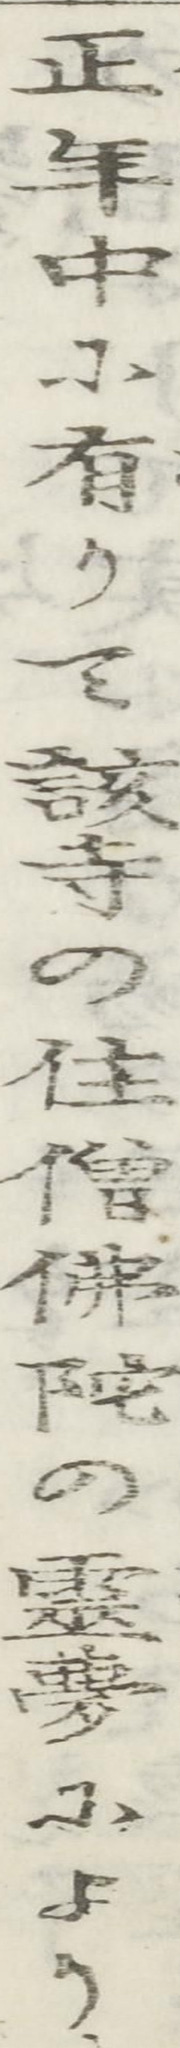正年中に有りて該寺の住僧仏陀の霊夢により
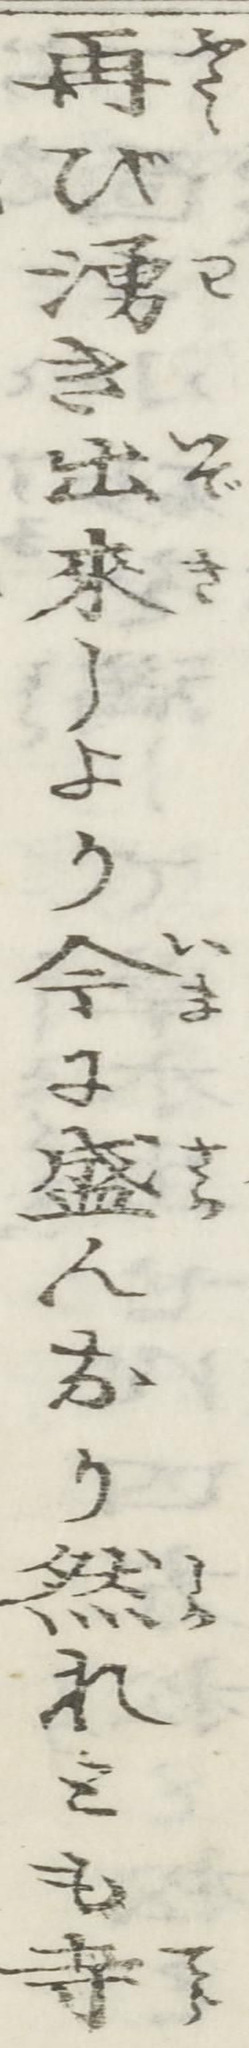再び湧き出来しより今に盛んなり然れども寺
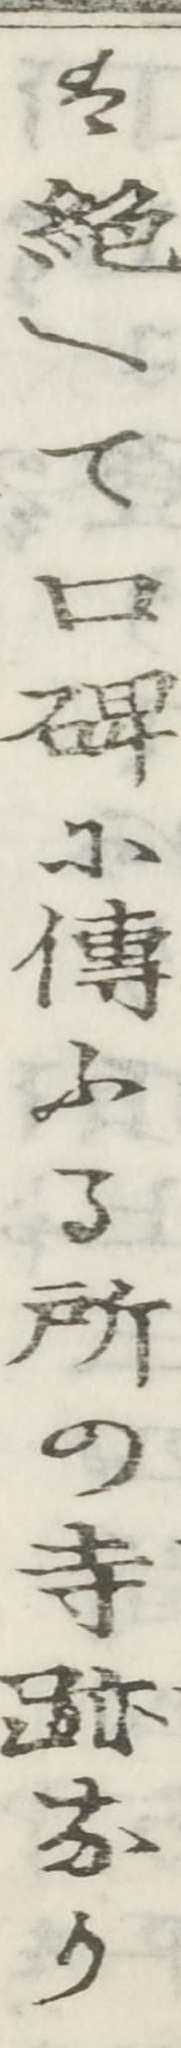は絶へて口碑に伝ふる所の寺跡なり
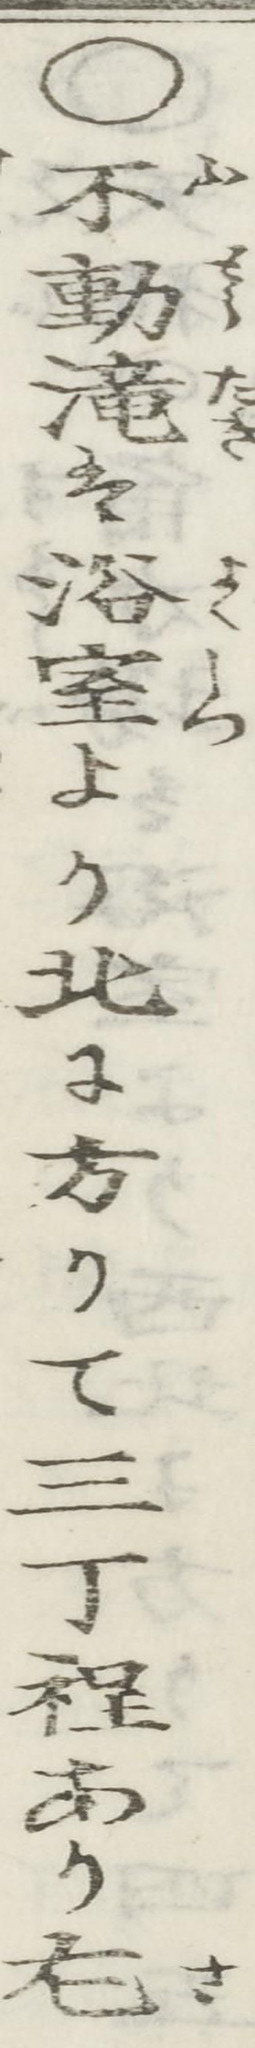〇不動滝は浴室より北に方りて三丁程あり左
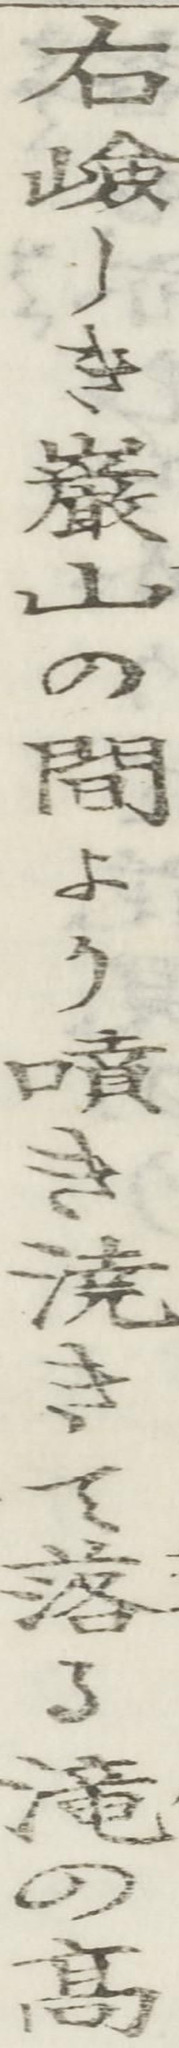右嶮しき巌山の間より噴き澆きて落る滝の高
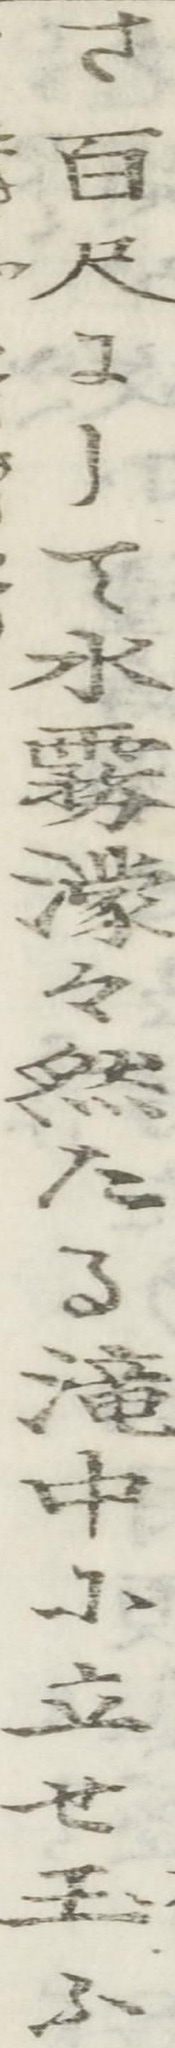さ百尺にして水霧濛々然たる滝中に立せ玉ふ
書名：鎌先温泉由來記
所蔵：東京大学地震研究所図書室 Earthquake Research Institute Library, The University of Tokyo, JAPAN
